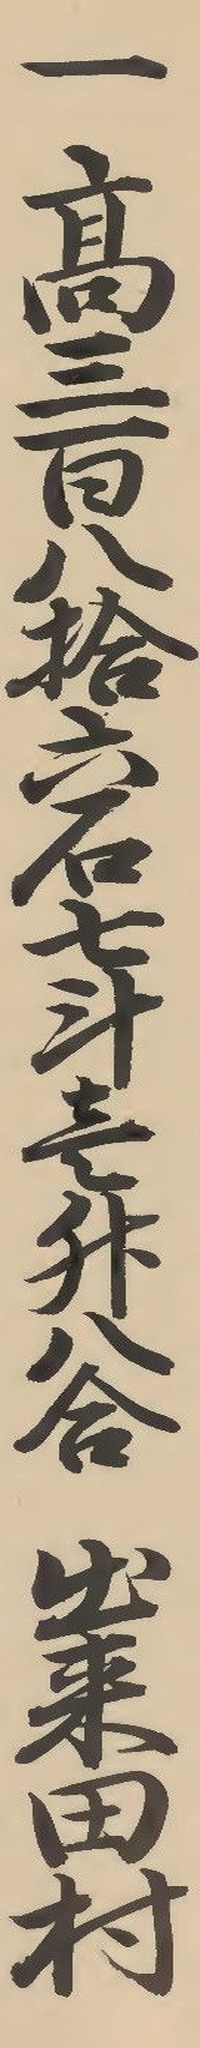一高三百八拾六石七斗壱升八合出来田村
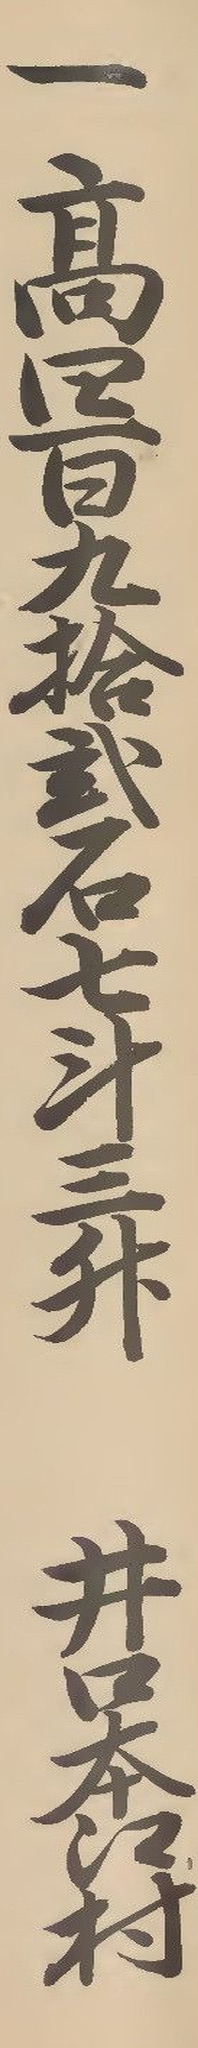一高四百九拾弐石七斗三升井口本江村
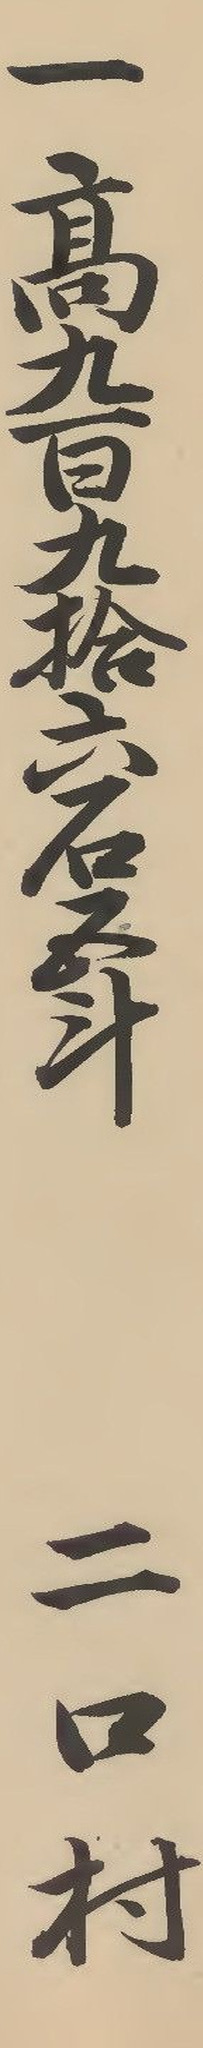一高九百九拾六石五斗二口村

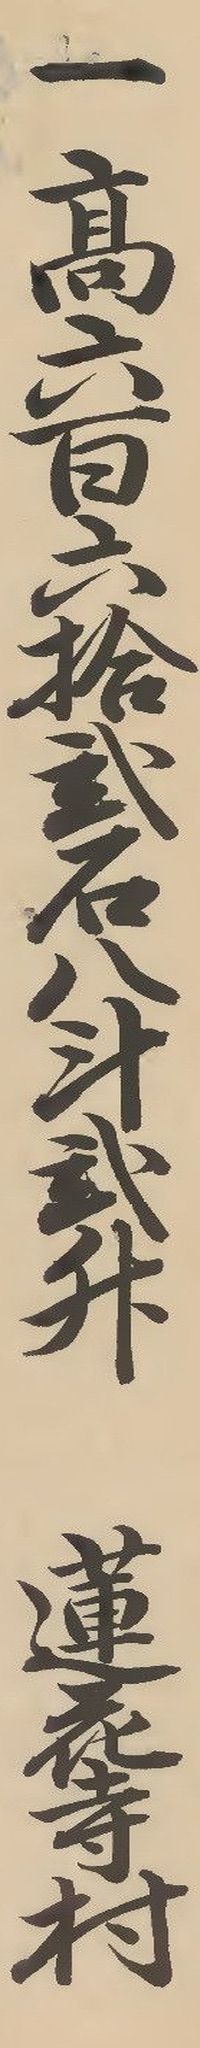一高六百六拾弐石八斗弐升蓮花寺村
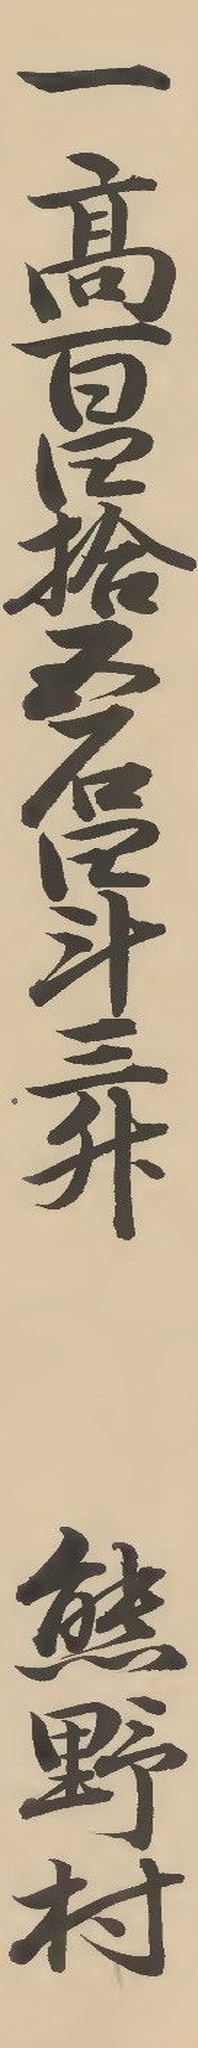一高百四拾五石四斗三升熊野村
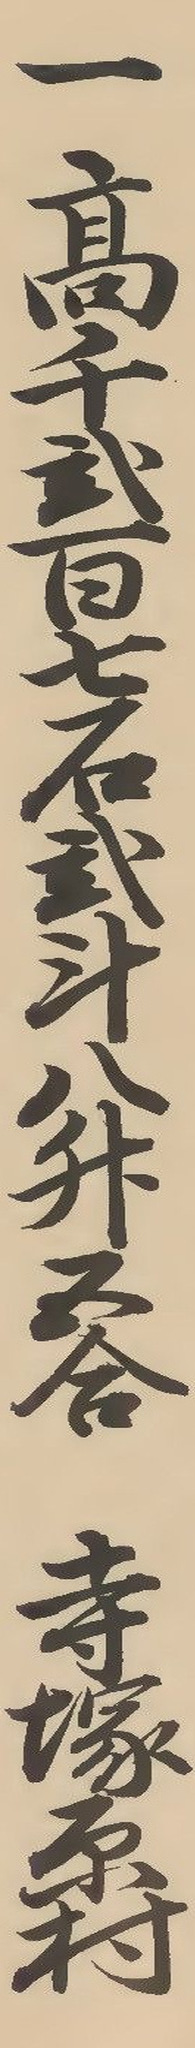一高千弐百七石弐斗八升五合寺塚原村
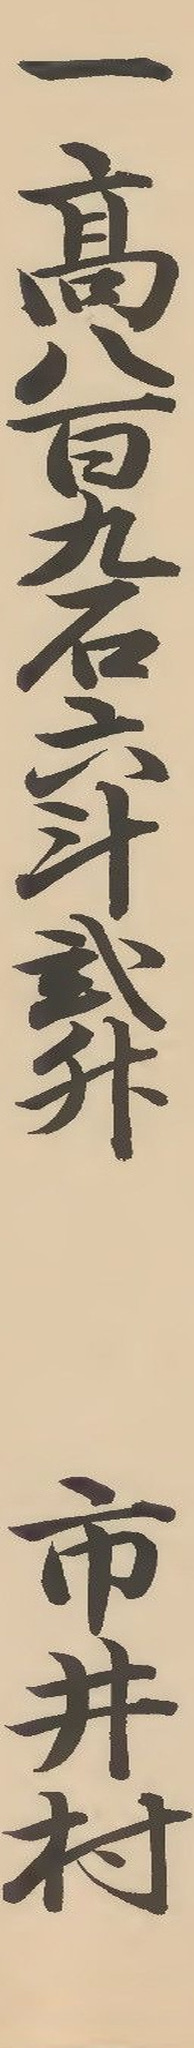一高八百九石六斗弐升市井村
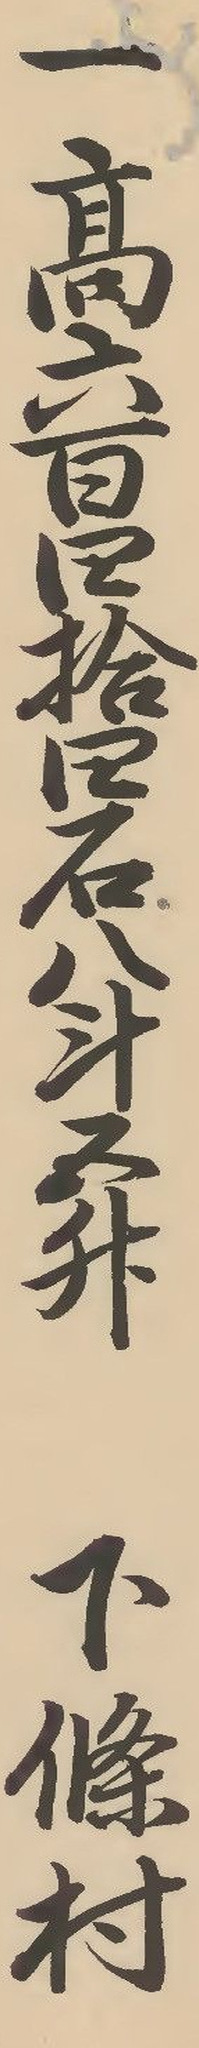一高六百四拾四石八斗五升下条村

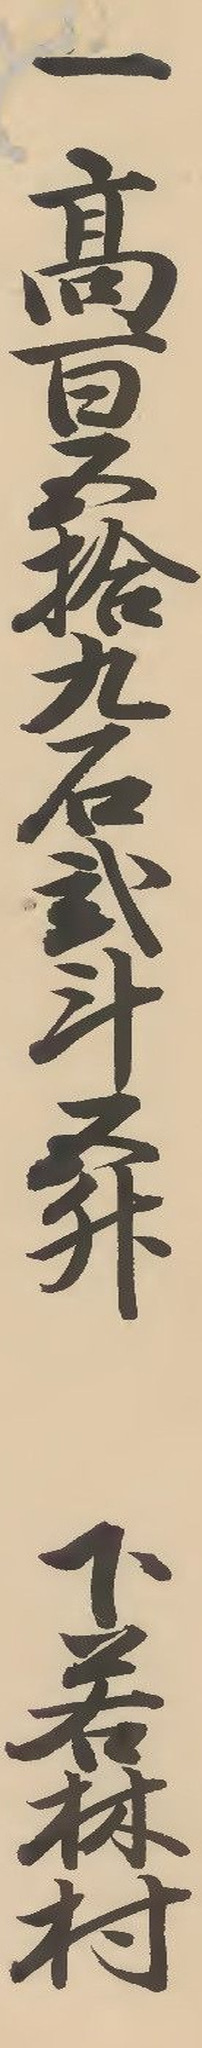一高百五拾九石弐斗五升下若林村
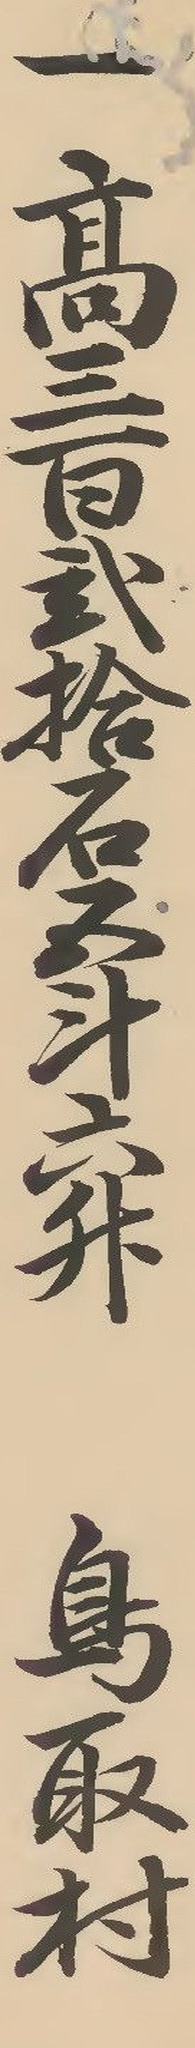一高三百弐拾石五斗六升鳥取村

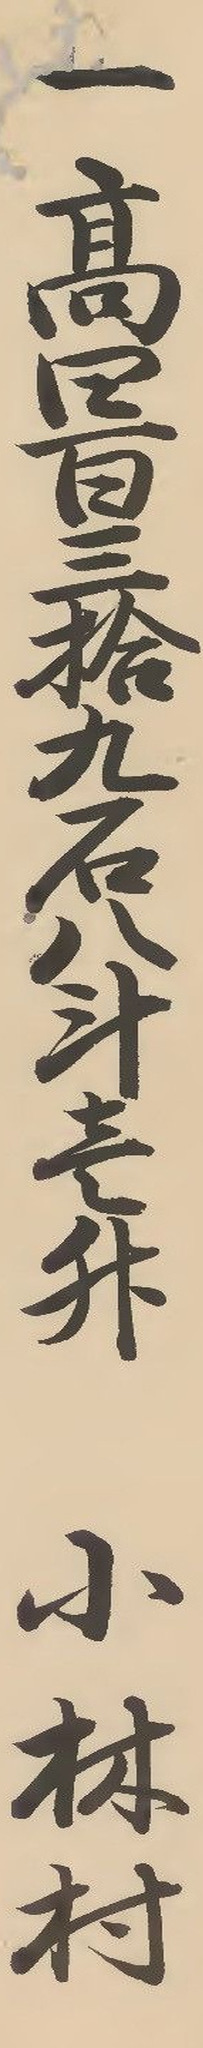一高四百三拾九石八斗壱升小林村
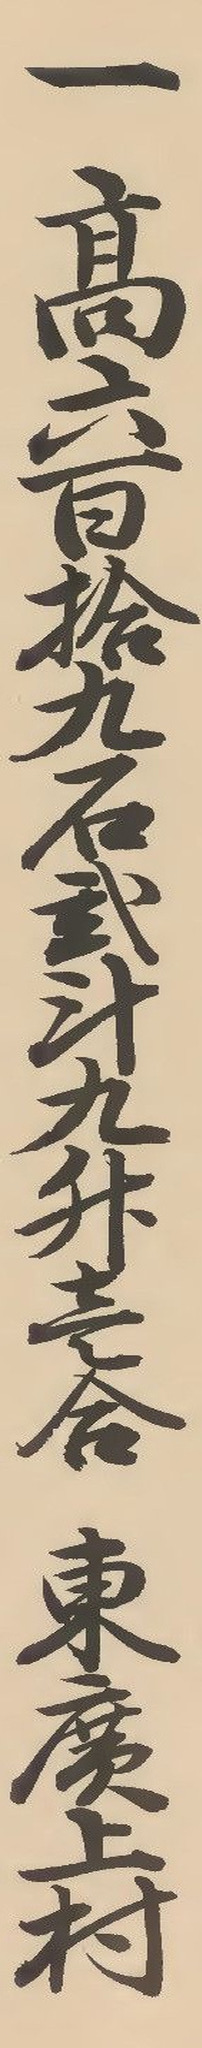一高六百拾九石弐斗九升壱合東広上村
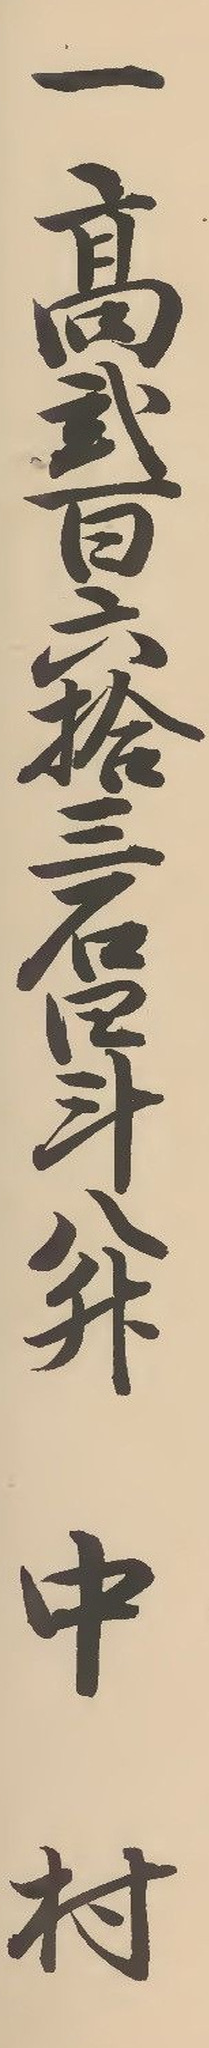一高弐百六拾三石四斗八升中村
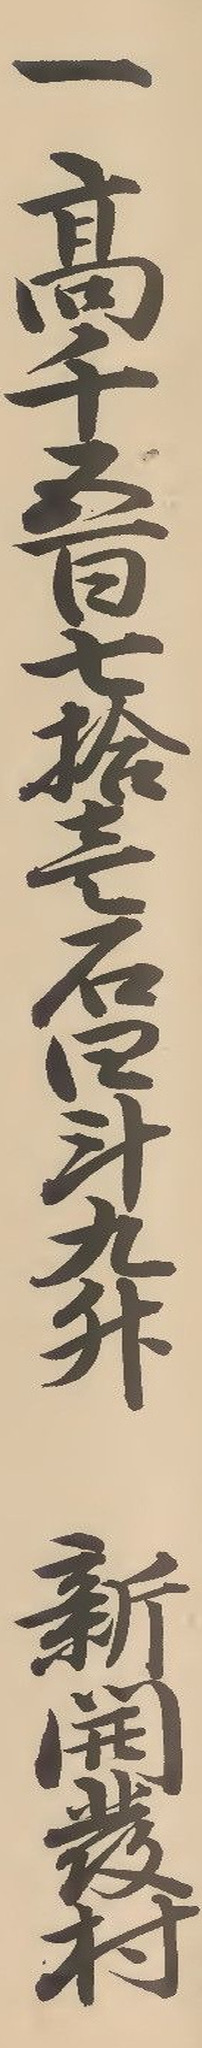一高千五百七拾壱石四斗九升新開発村
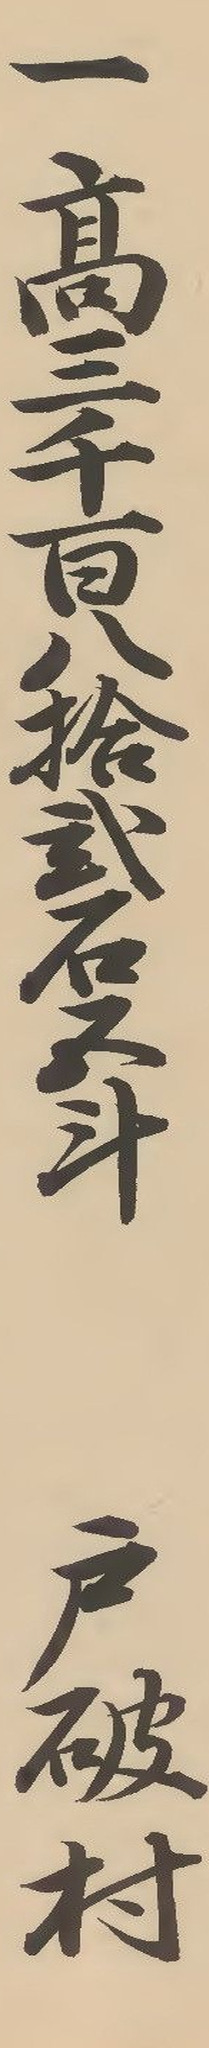一高三千百八拾弐石五斗戸破村
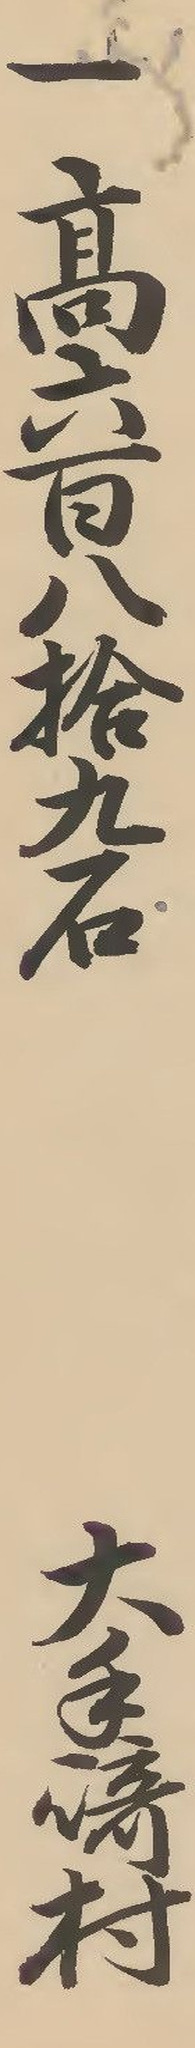一高六百八拾九石大手崎村
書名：越中国郷帳
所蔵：国立公文書館 National Archives of Japan
